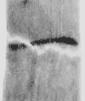一
